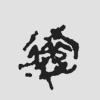失
